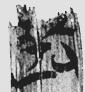毀
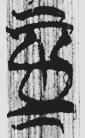亞
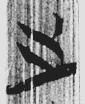之
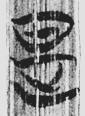是
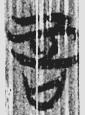言
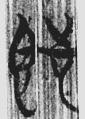既
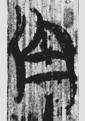於
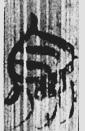衆
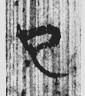巳（已）
